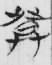登
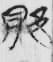○（纓）
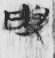受
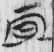○（期）
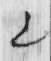乙
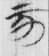亥
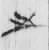之
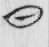日
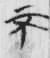不
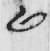㠯（以）
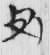死
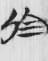於
